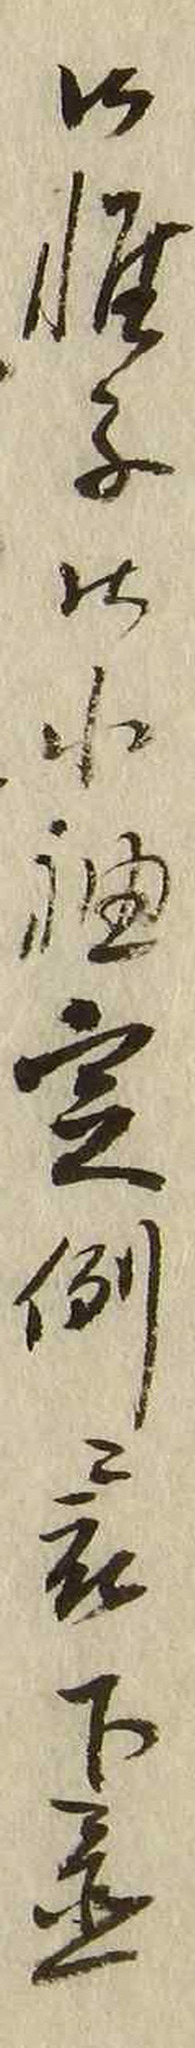御帷子御小袖定例ニ被下置
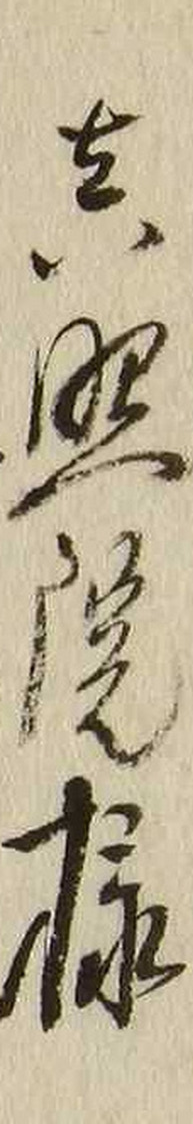真照院様
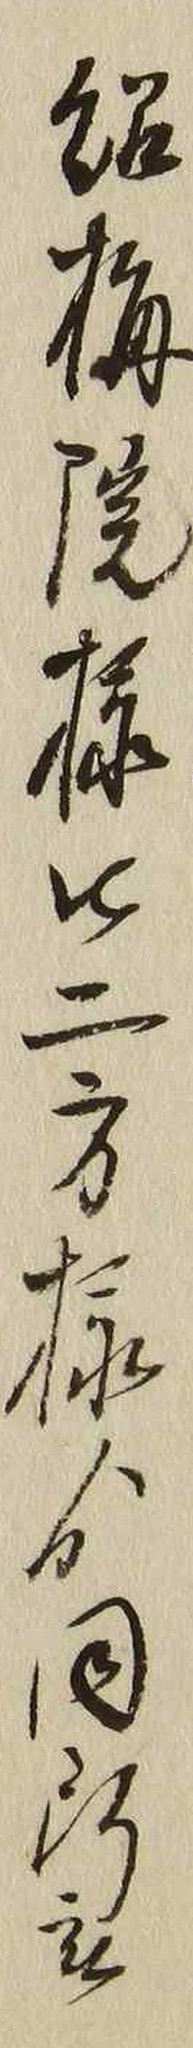紹栴院様御二方様ゟ同断被
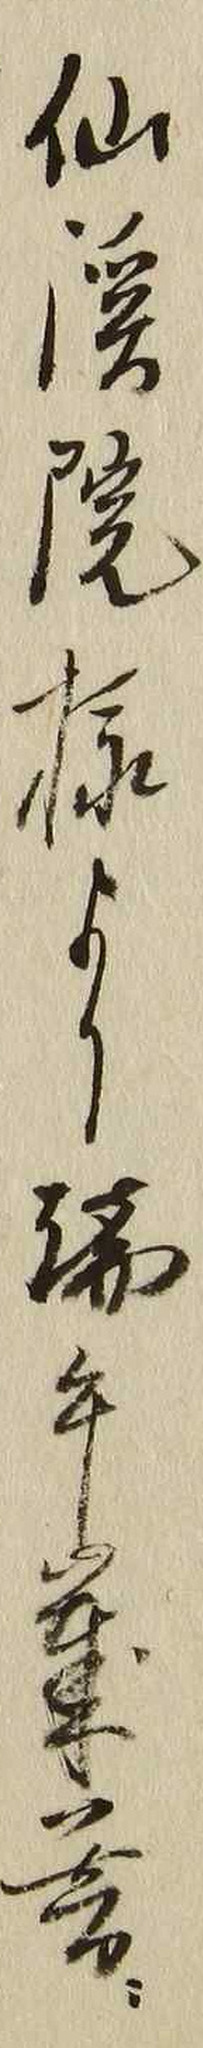仙渓院様より端午歳暮ニ
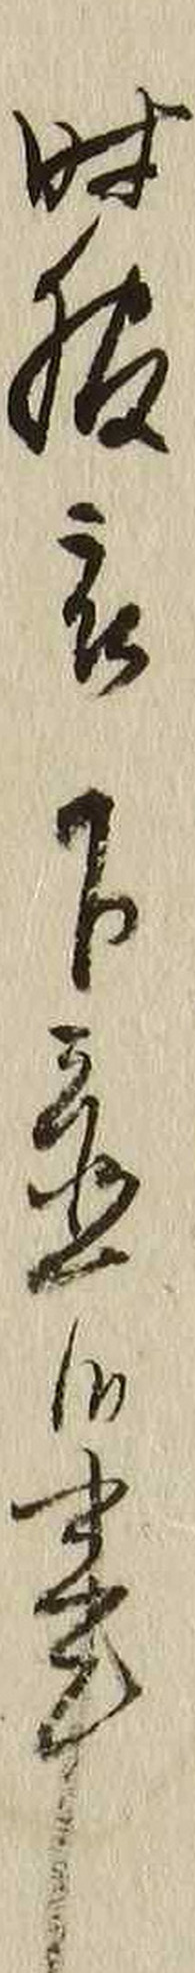時服被下置候事
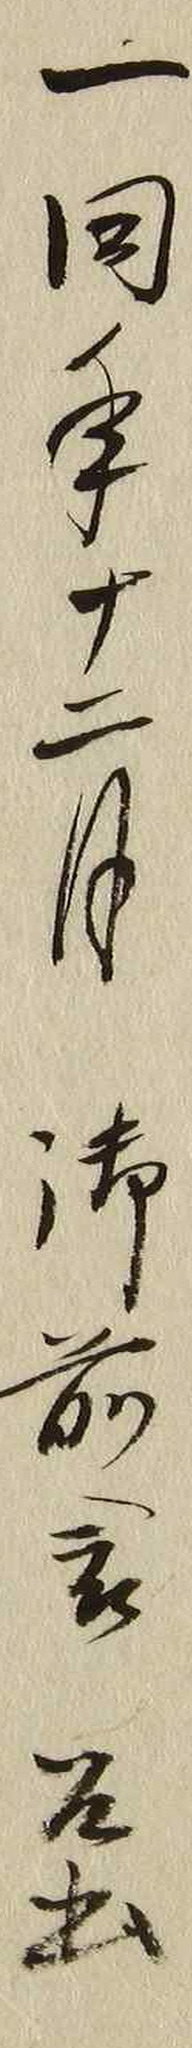一同年十二月御前へ被召出
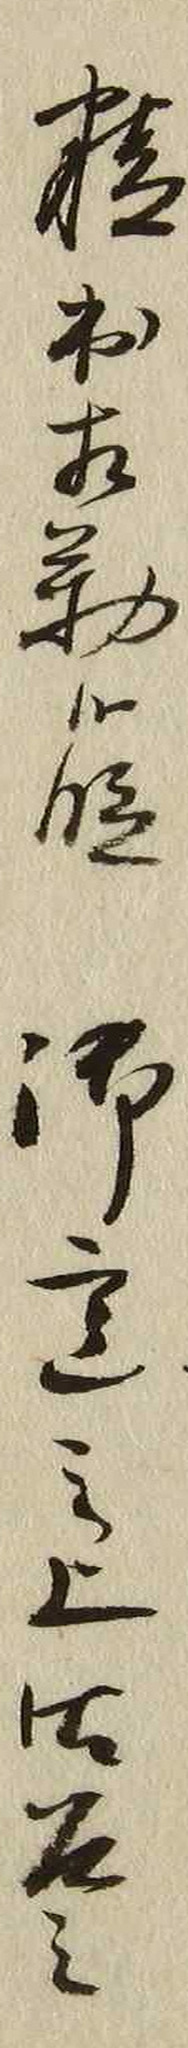精出相勤候段御意之上御召之
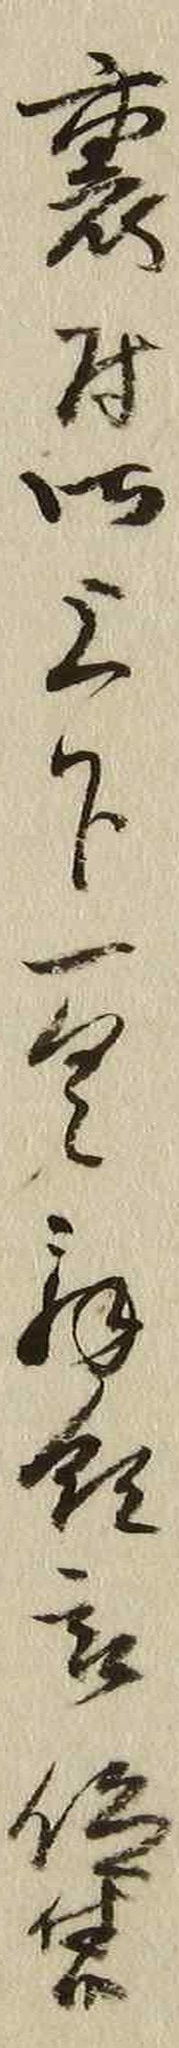裏付御上下一具拝領被仰付候
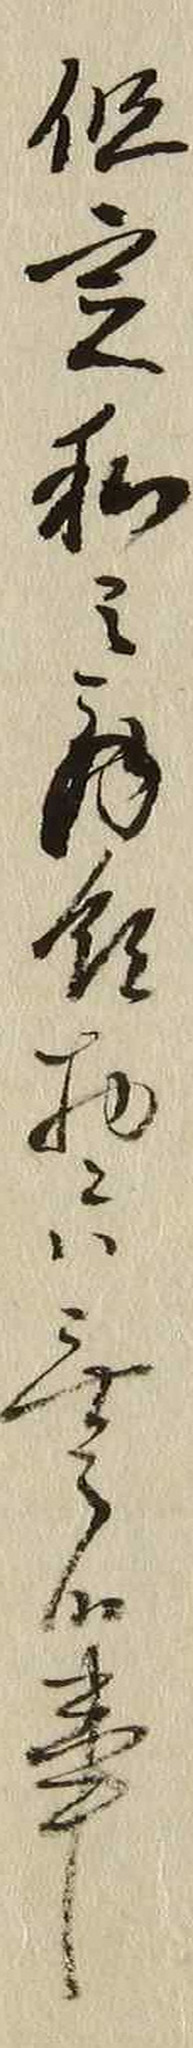但定和之拝領物ニハ無之候事
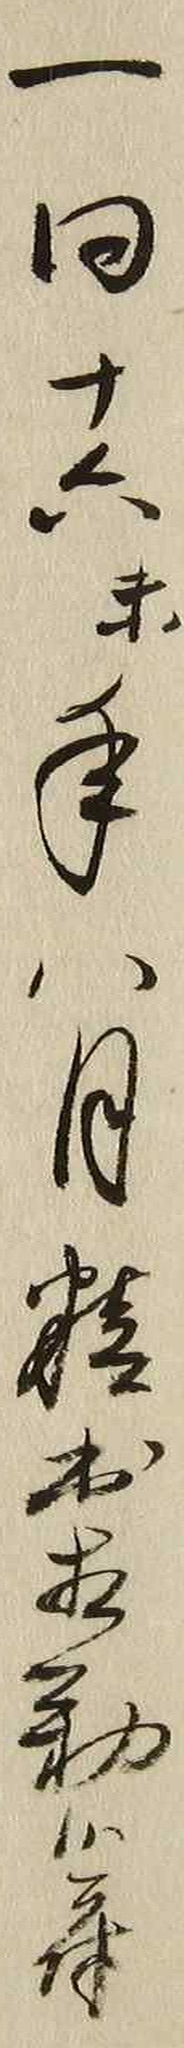一同十六未年八月精出相勤候ニ付
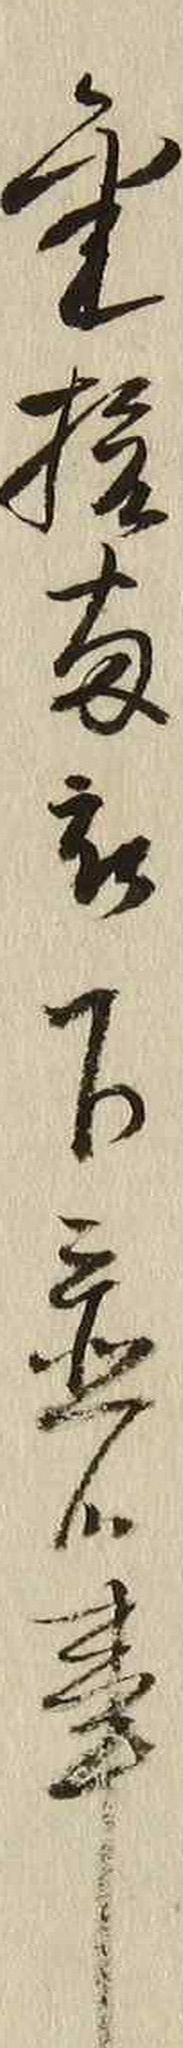金拾両被下置候事
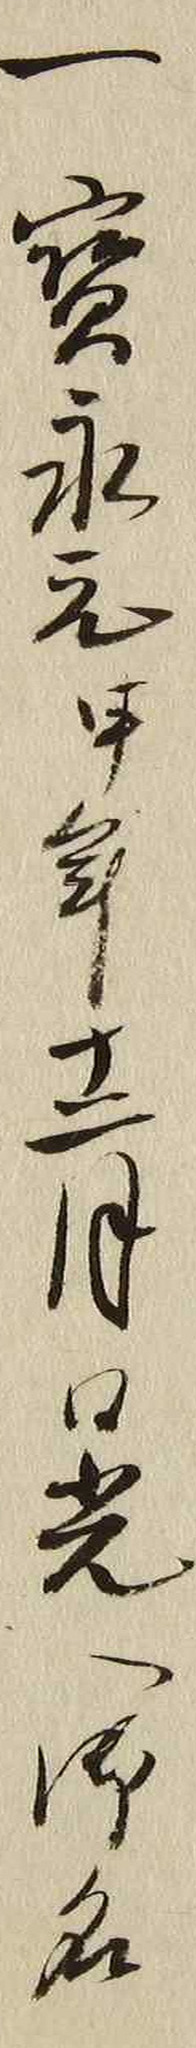一宝永元申年十二月日光へ御名
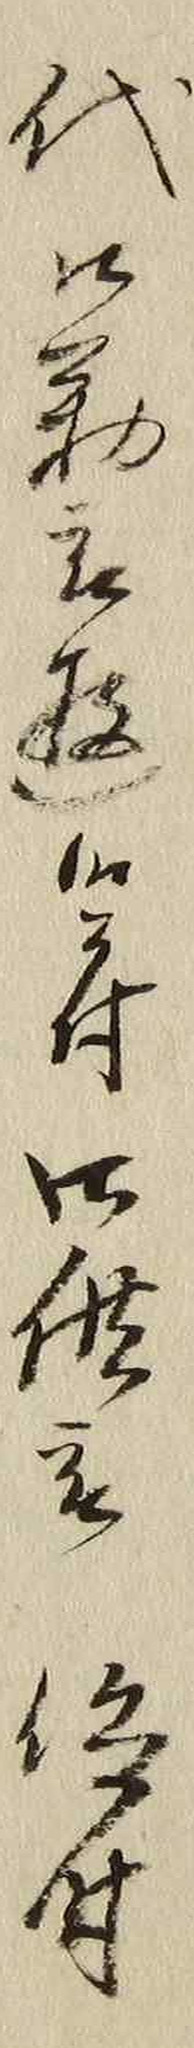代御勤被遊候ニ付御供被仰付
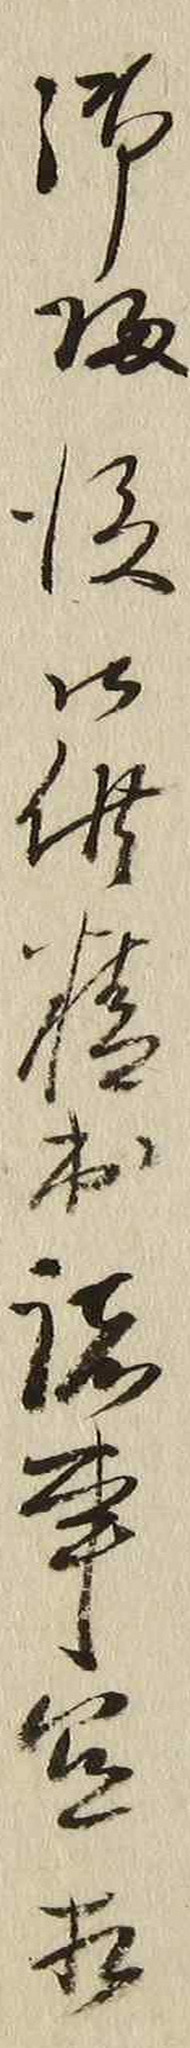御帰後御供精出諸事宜相
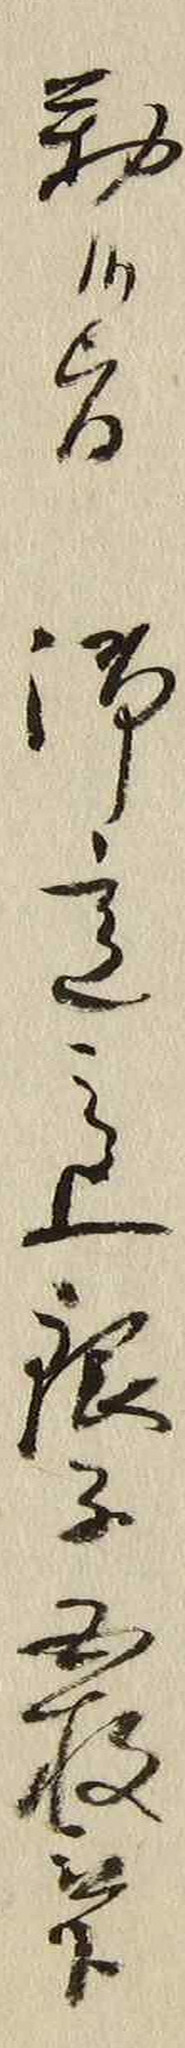勤候間御意之上銀子五枚被下
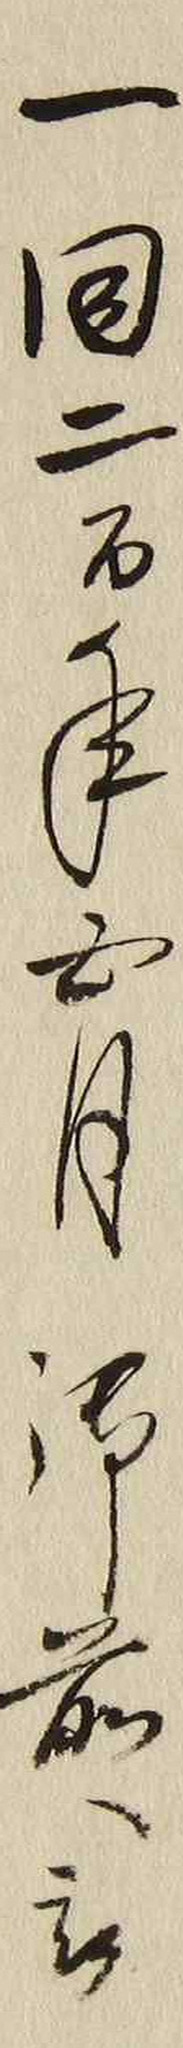一同二酉年五月御前へ被
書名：諸士系譜　巻之351　す之部1
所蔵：会津若松市立会津図書館
